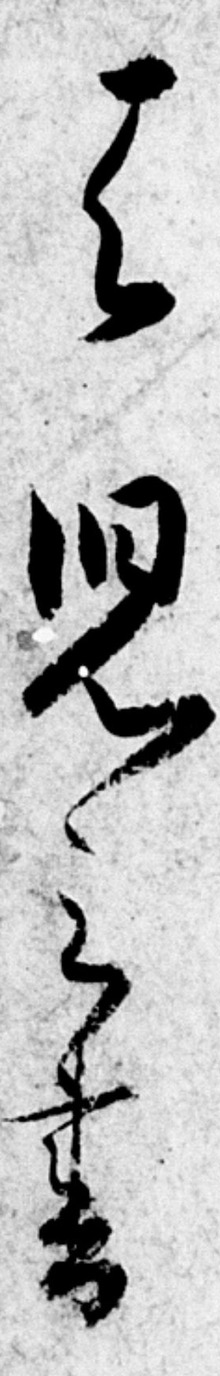天児之書

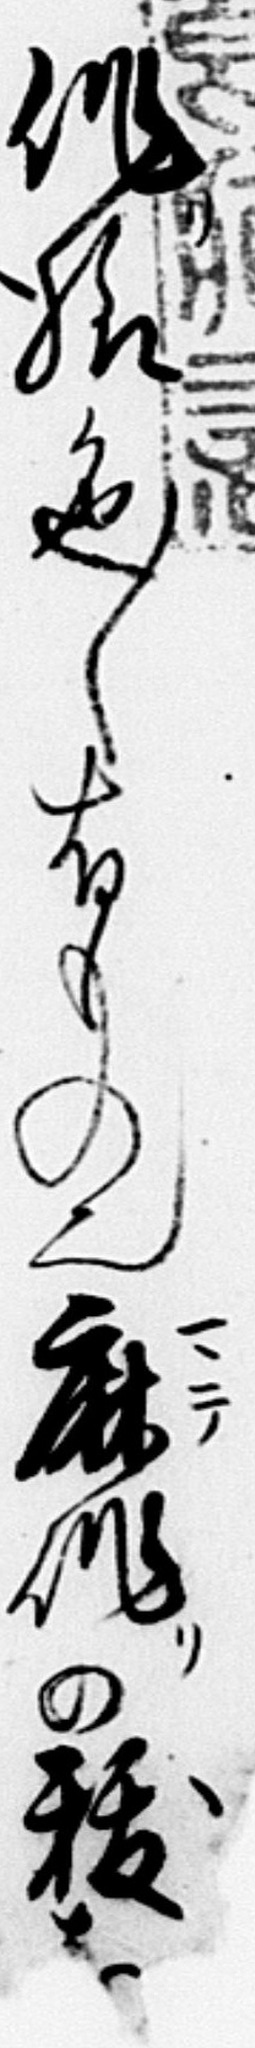作様色〳〵有もの也麻作りの祓を
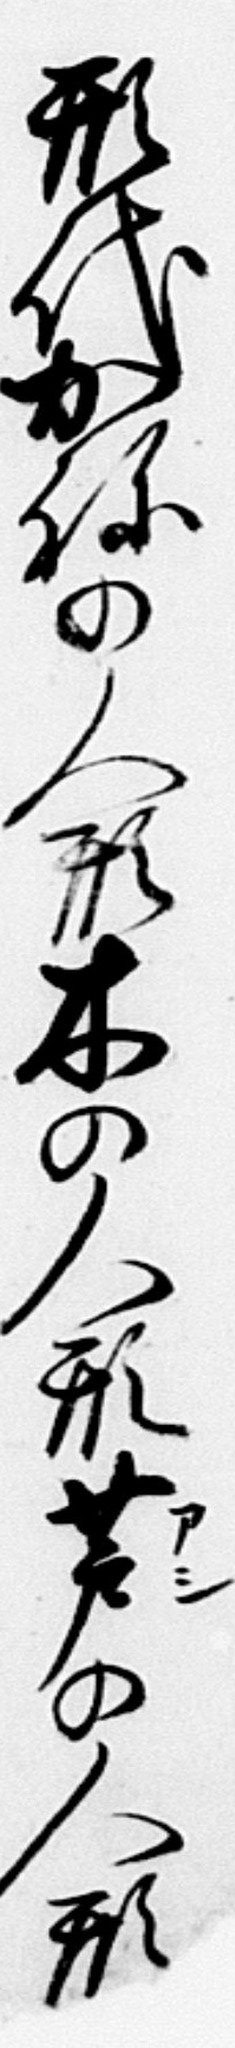形代かねの人形木の人形芦の人形
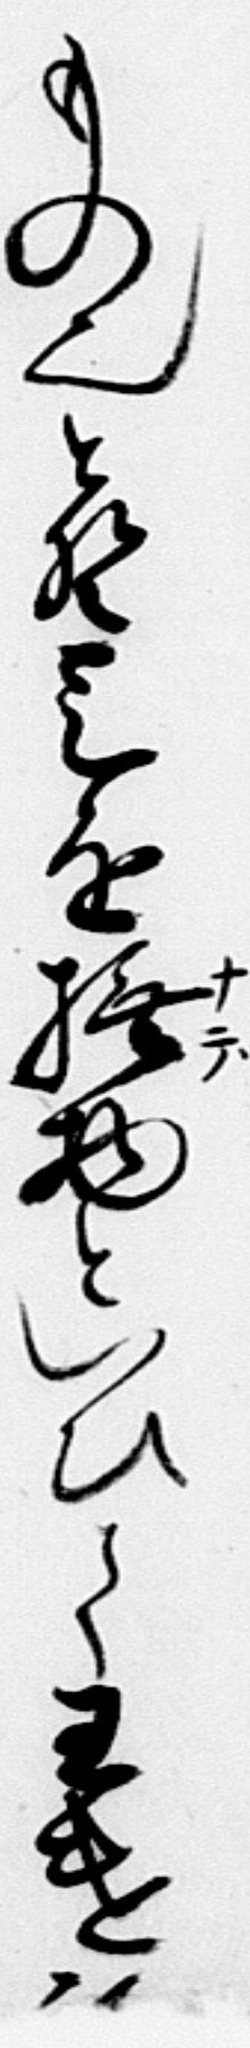もの也とそ是を撫物といひてわけ
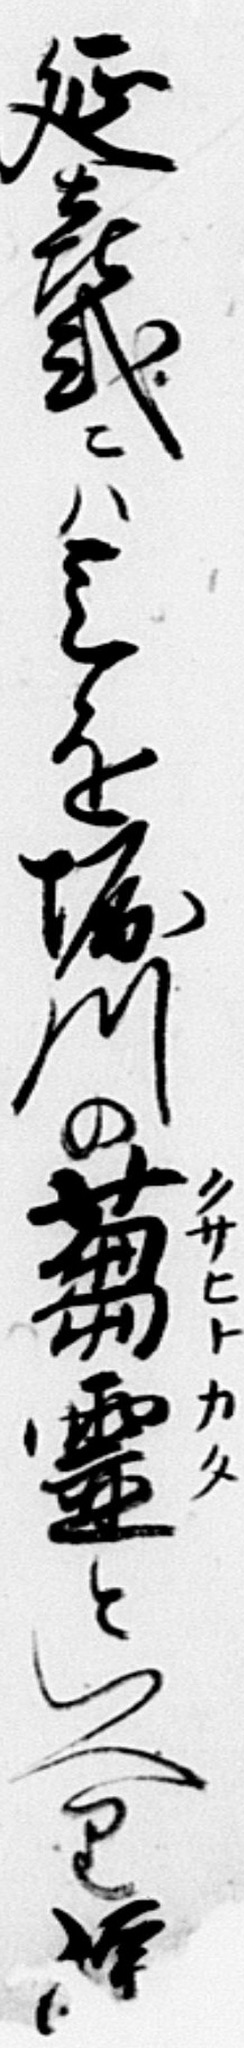延喜式には是を堀川の蒭霊といへり
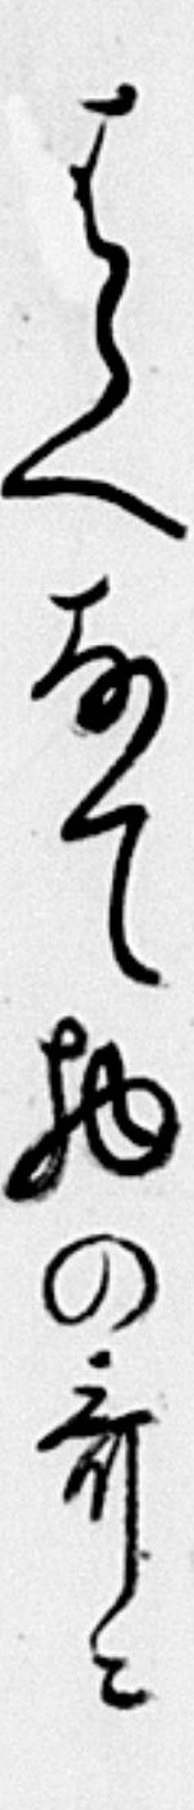はらへなて物の哥に
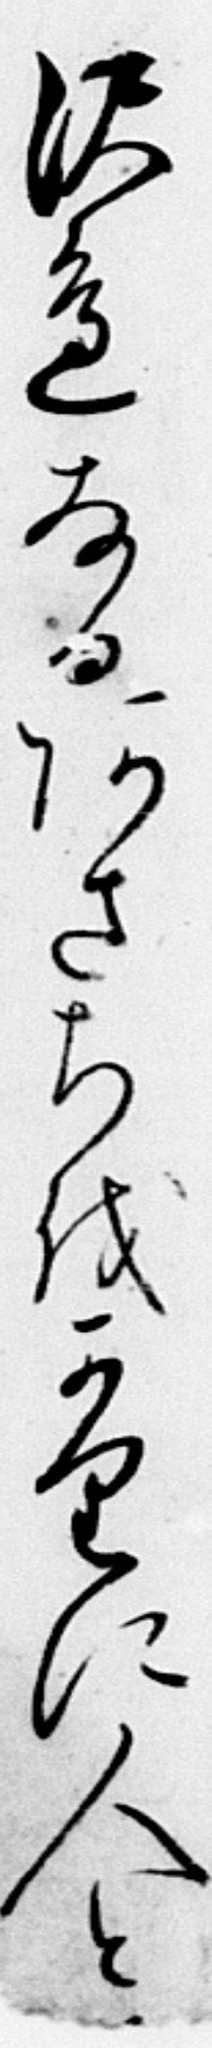沢辺なるあさちをかりに人と
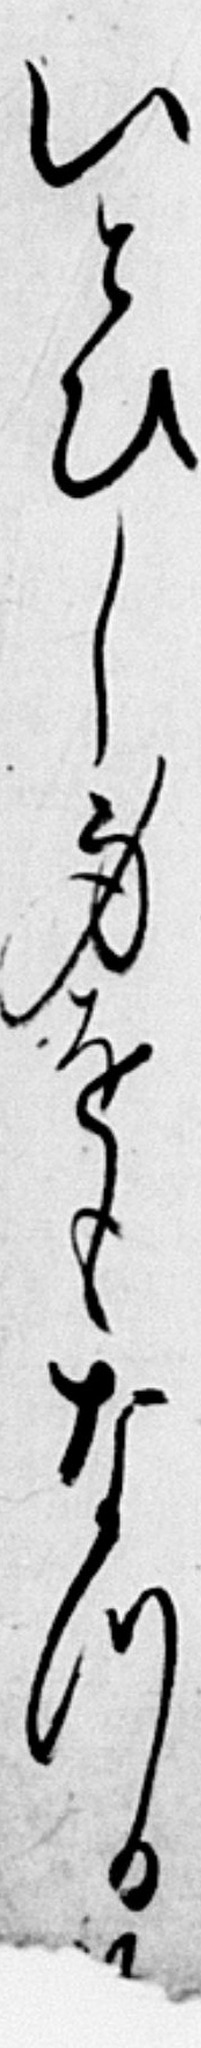いとひし身をもなつる

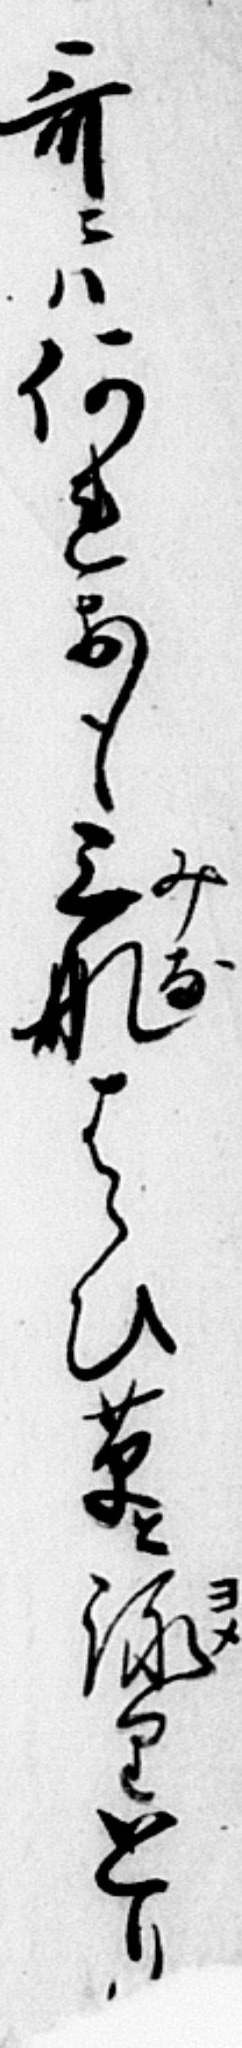哥には何れおも三那はらひ草と詠りと
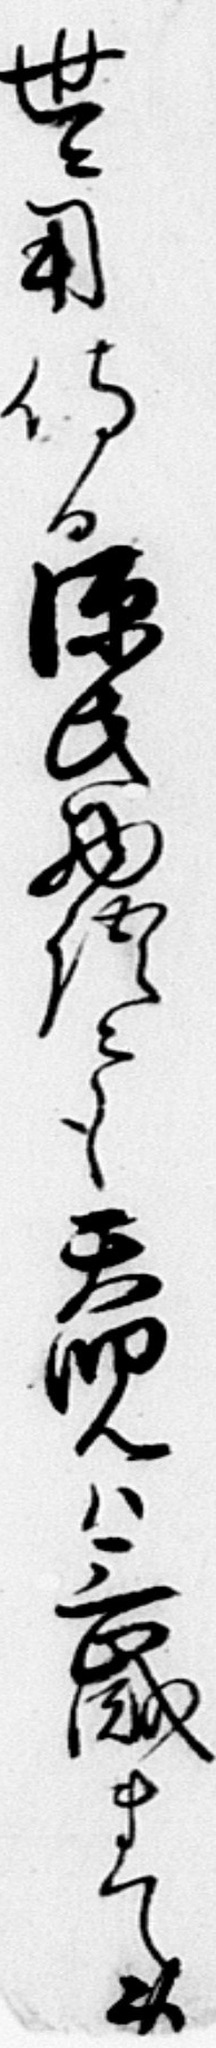世に用侍る源氏物語にも天児は三歳まて
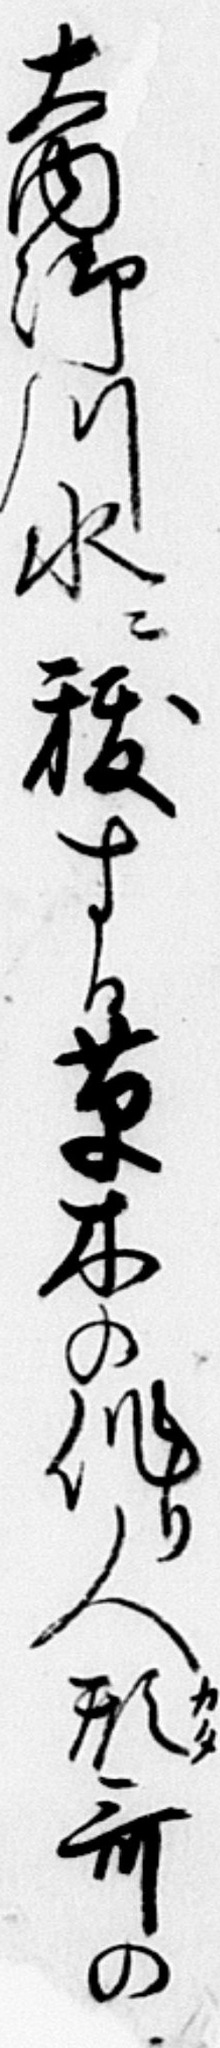大内御川水に祓する草木の作り人形哥の
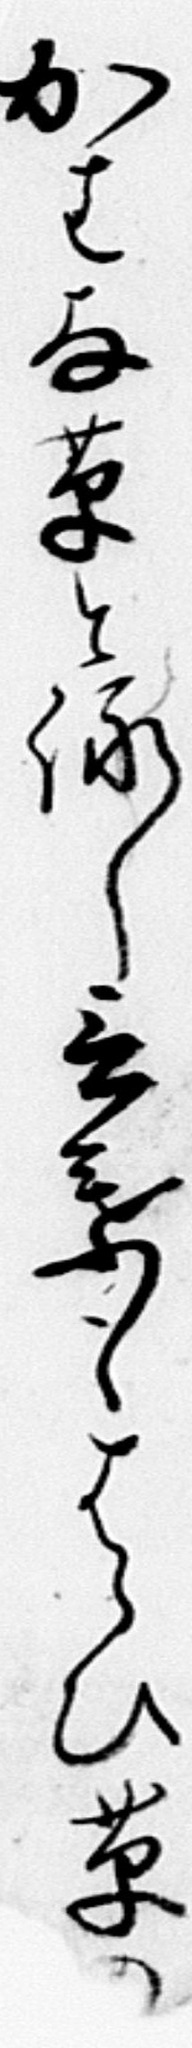かはな草と詠し言葉もはらひ草の
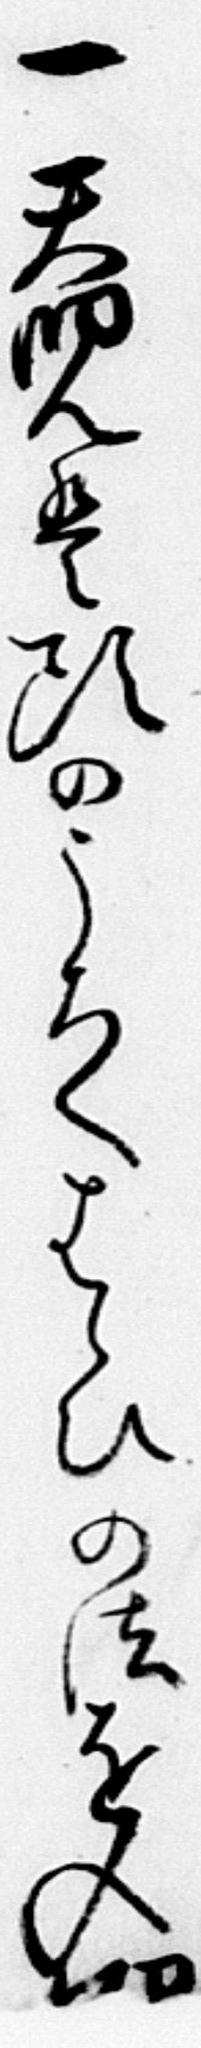一天児は頭のうちへはらひの法を入れ
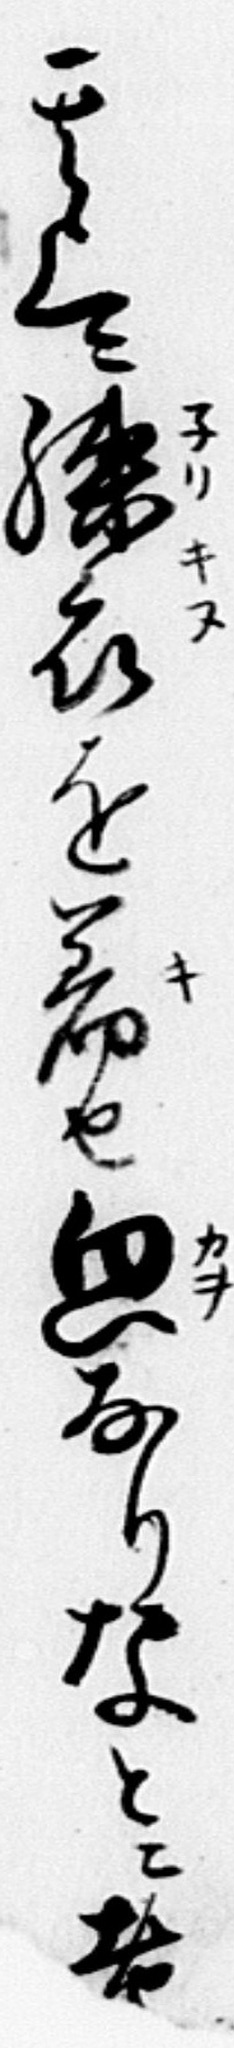其上に練衣を着せ㒵なりなとに
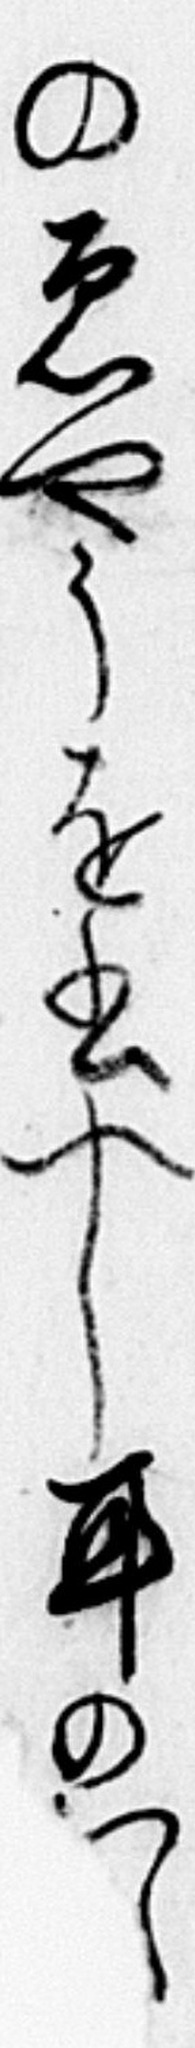のゑやうを書へし耳の
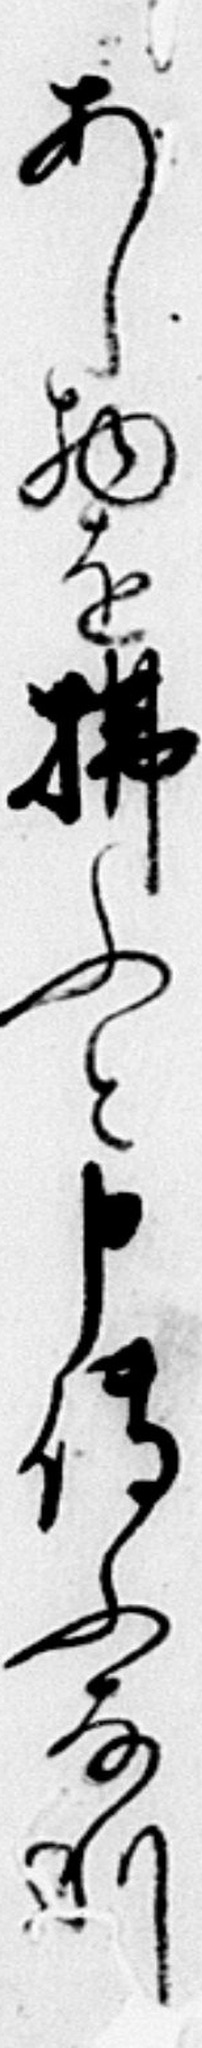あし物を払ふと申伝ふなり
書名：天児之書（あまがつのしょ）
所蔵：徳島県立図書館
